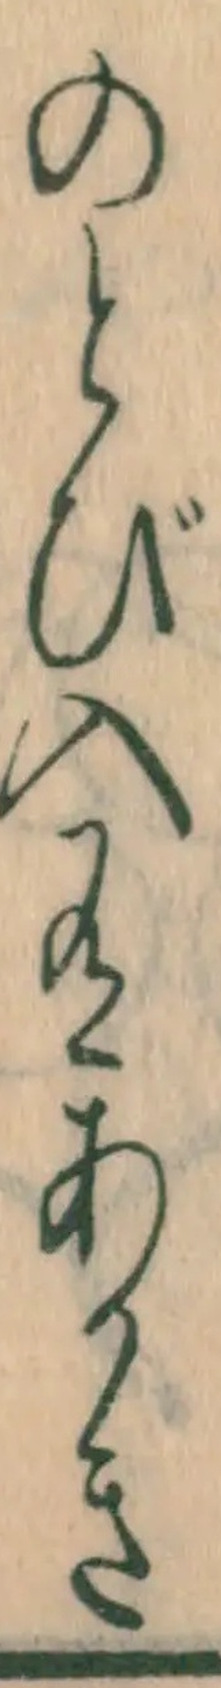のとび入有あかき
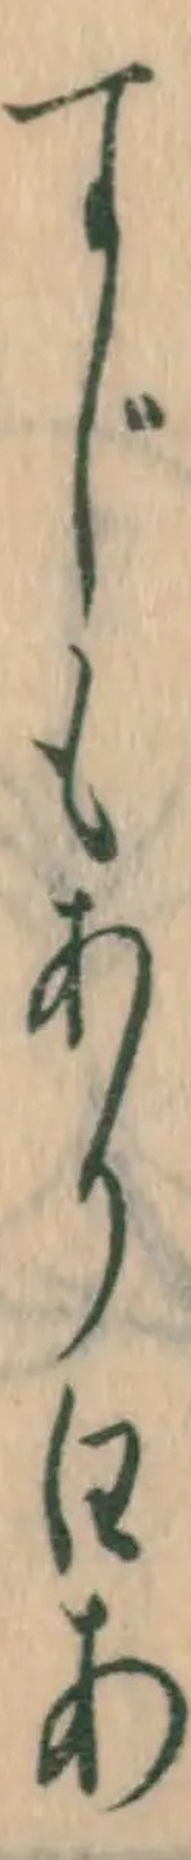すじもあり白あ
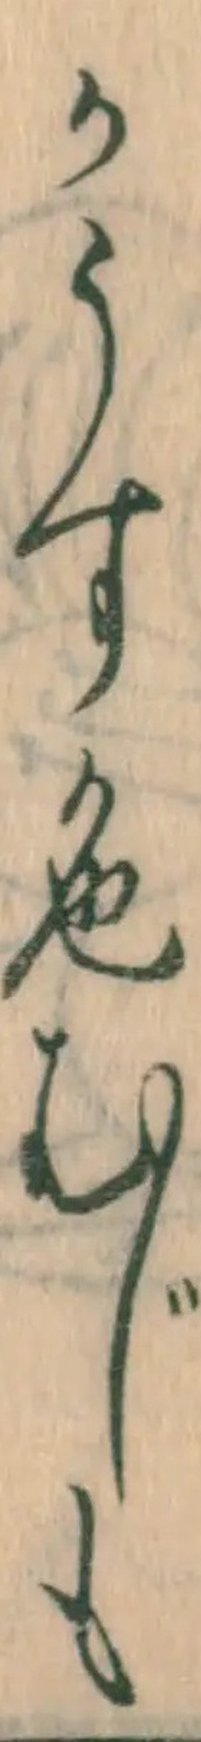かうす色むじも
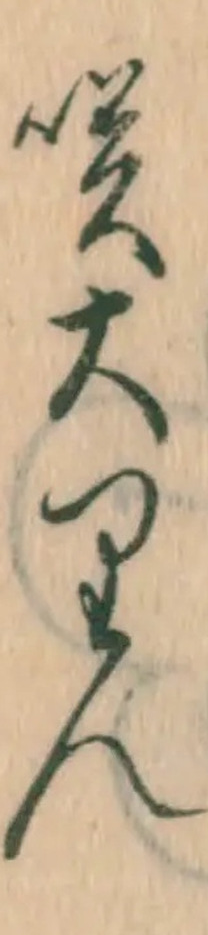咲大りん
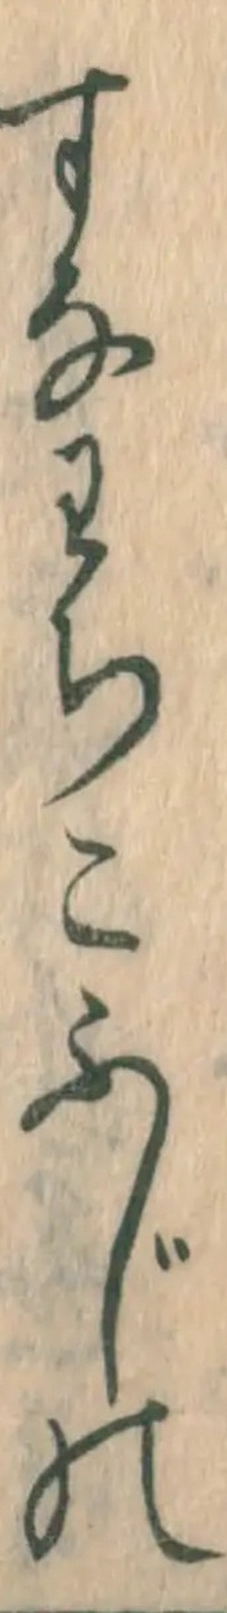すなわちこふじの
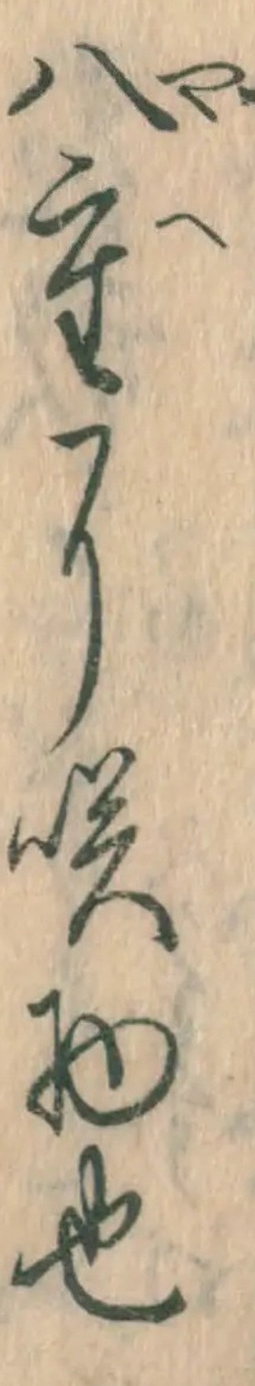八重に咲物也

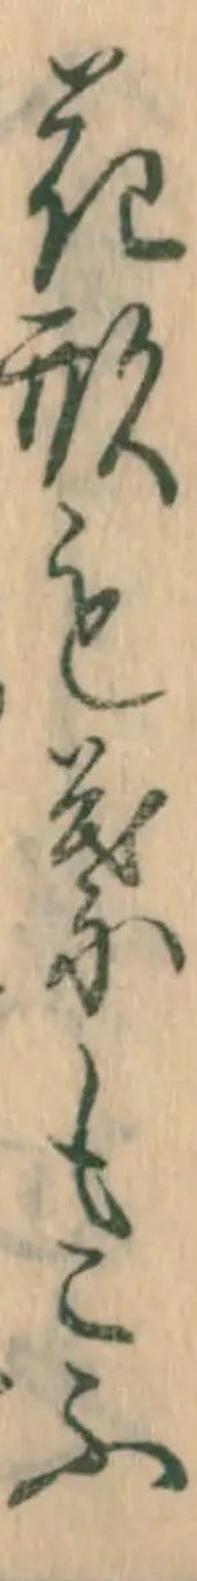花形も葉もこふ
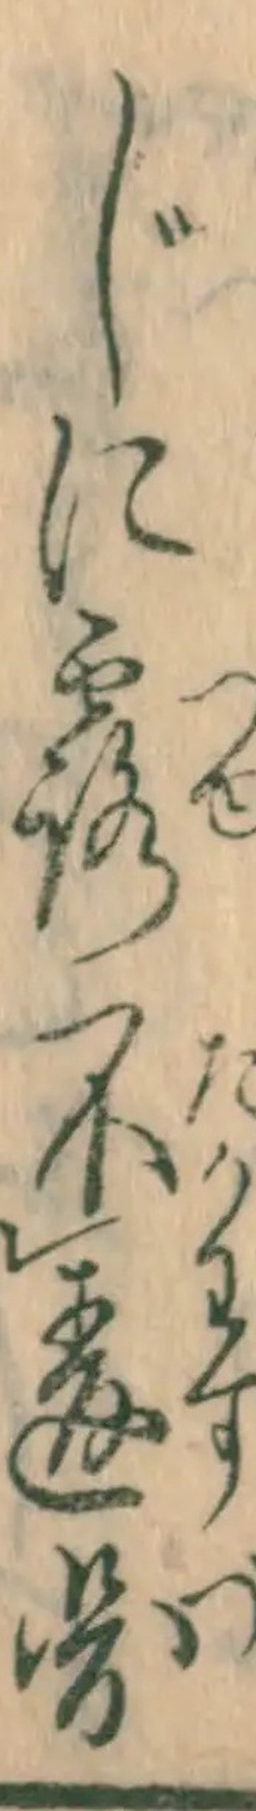じに露不違図
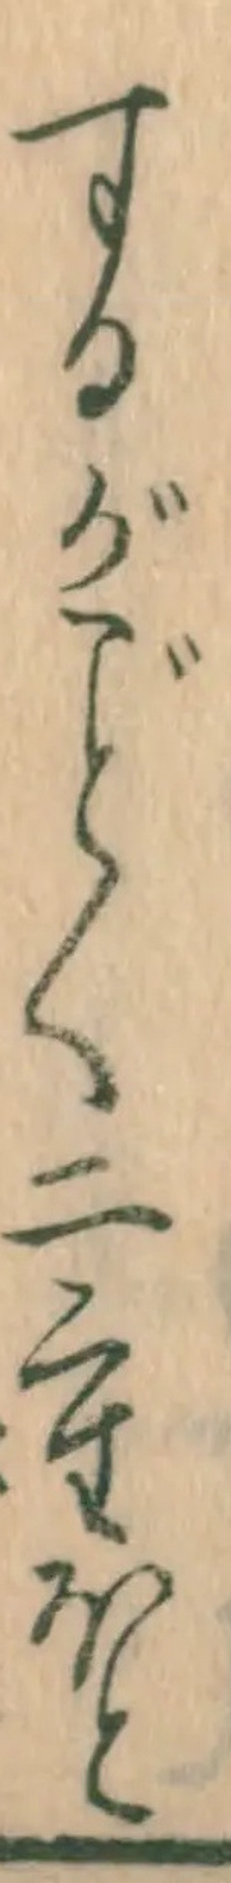するがごとく二重ほと
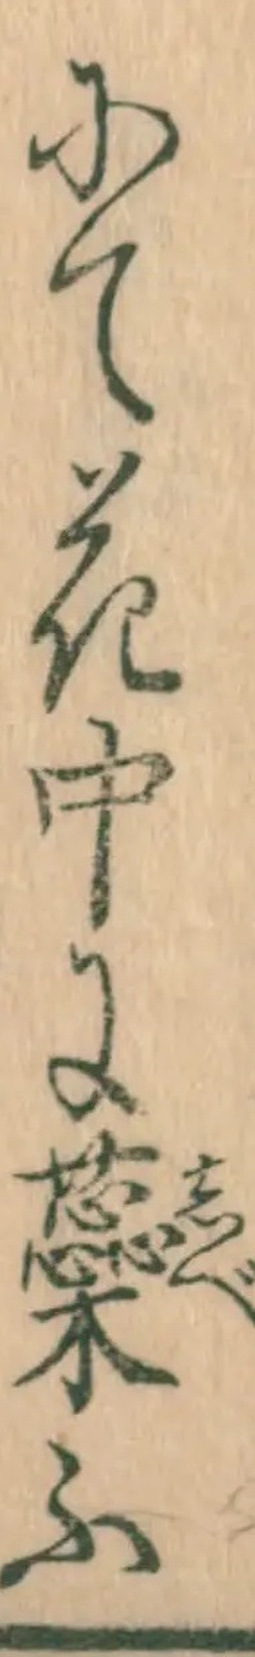にて花中に蘂ふ
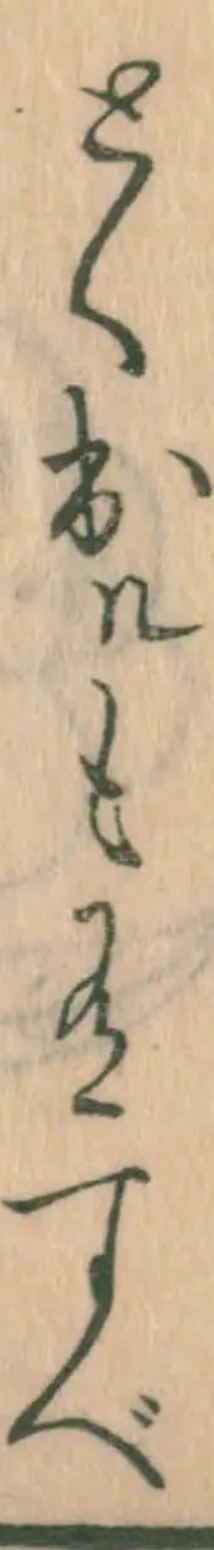とく出有すべ
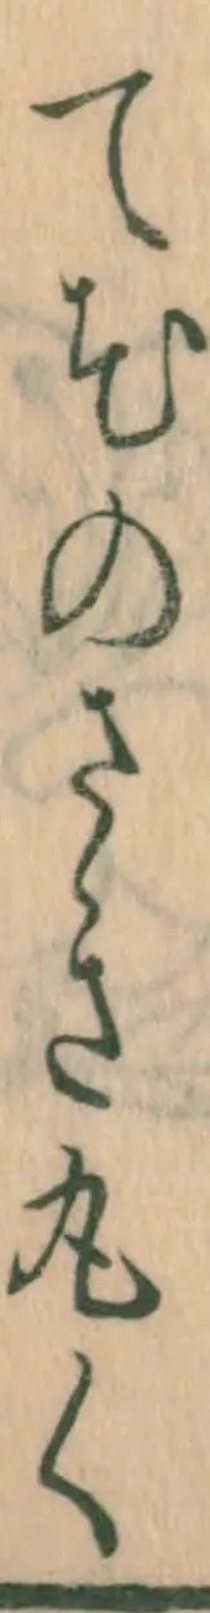て花のさき丸く
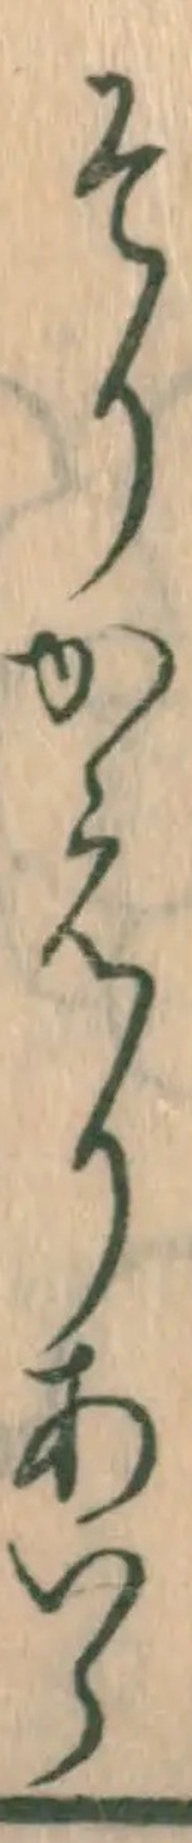そりかえりあいら
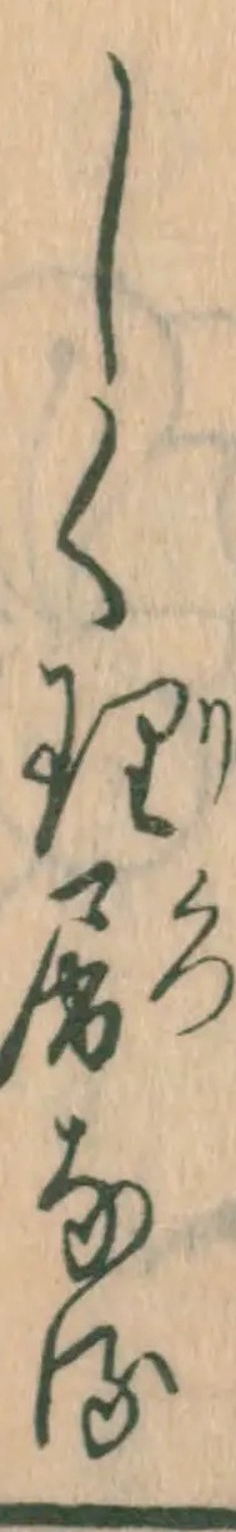しく理屈なる
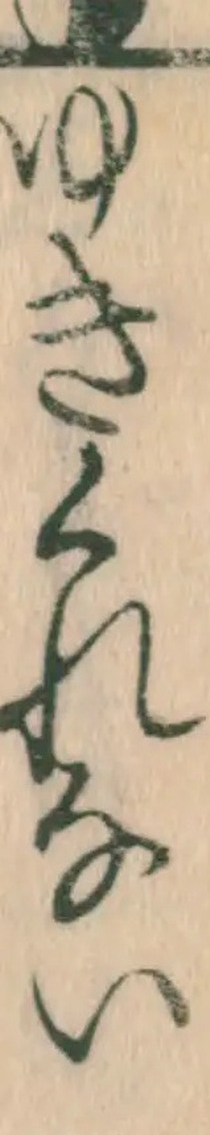ゆきくれない
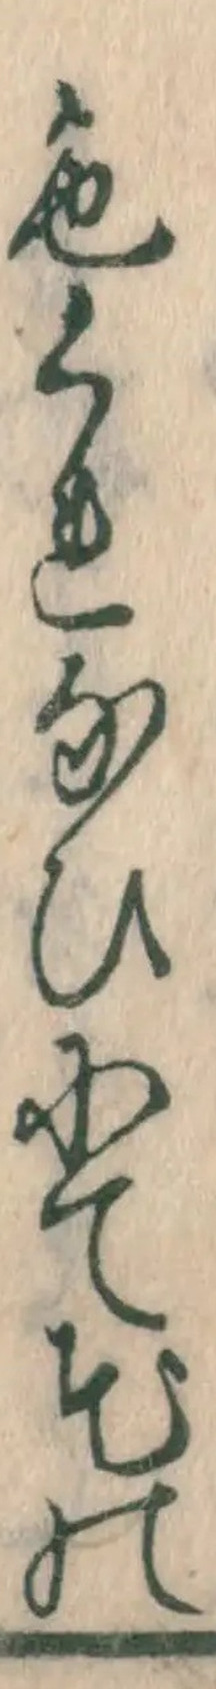色くれなひにて花の
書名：錦繍枕 5巻. [4]
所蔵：国立国会図書館 National Diet Library, JAPAN
